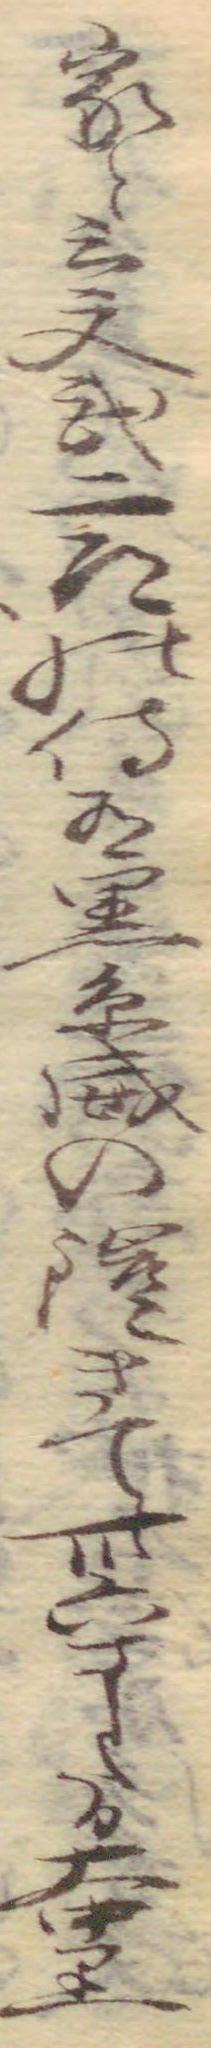家と云文武二道の侍有黒糸威の鎧きて卅六さしたる大中黒
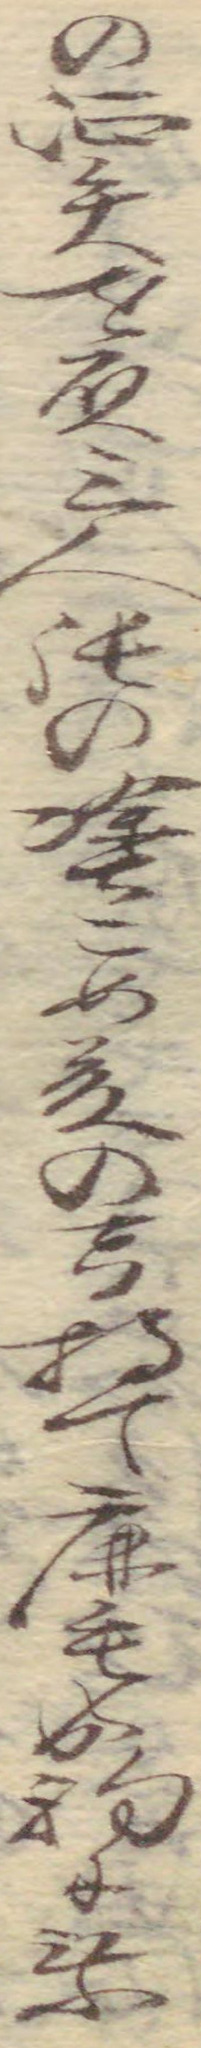の征矢を負三人張の塗こめ藤の弓持て鹿毛成駒に乗
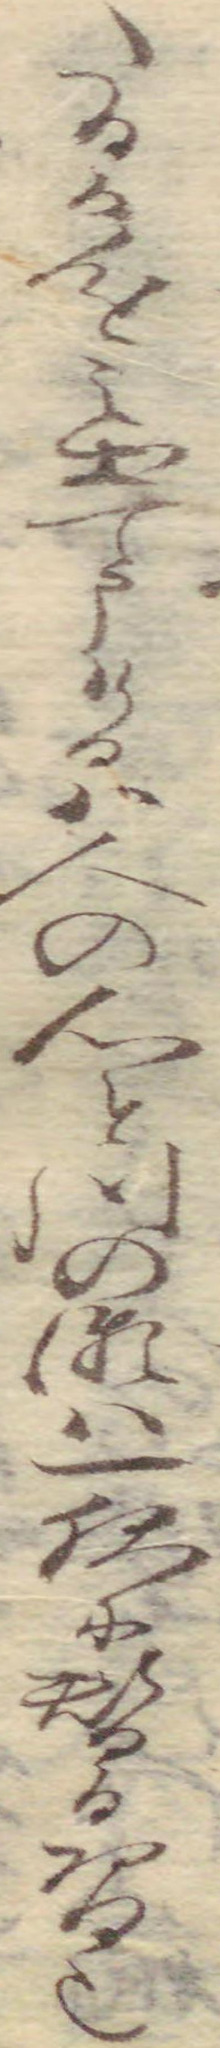たるか進み出て申けるは人の心と川の瀬は一夜に替る習也
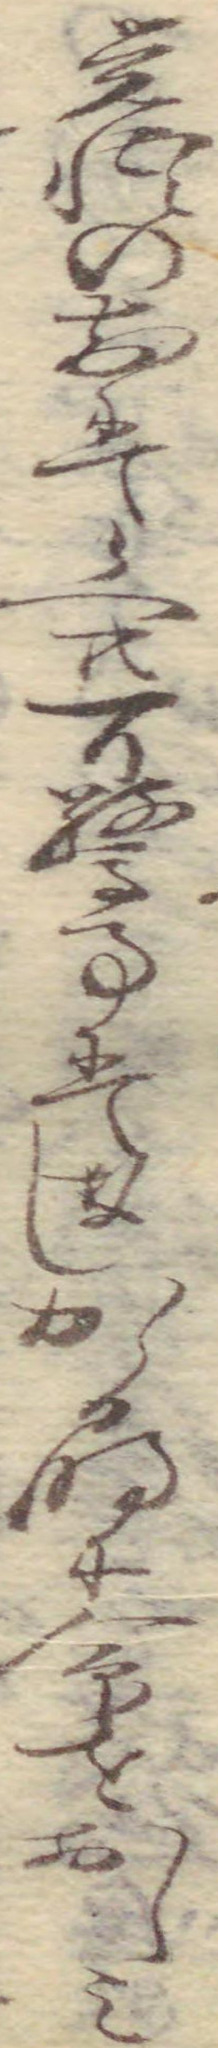覚悟の前にて候へ共可驚事にてなしかゝる時に命をおしみ
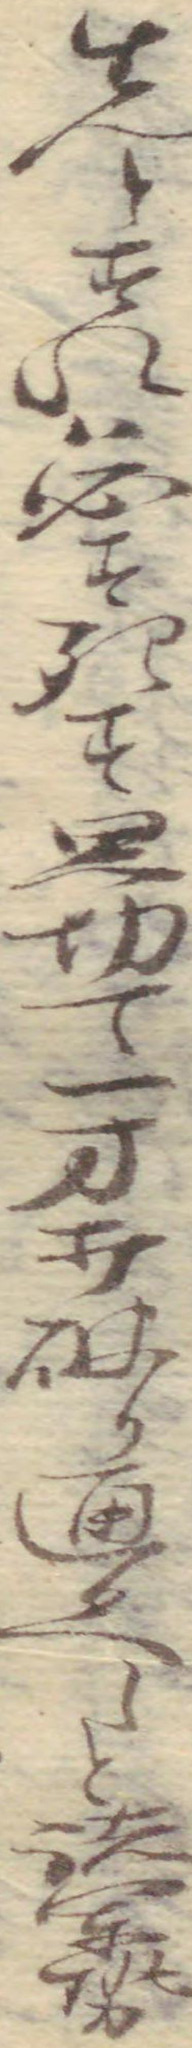生んとすれは必す死す思切て一方打破り通るへしと諸軍勢
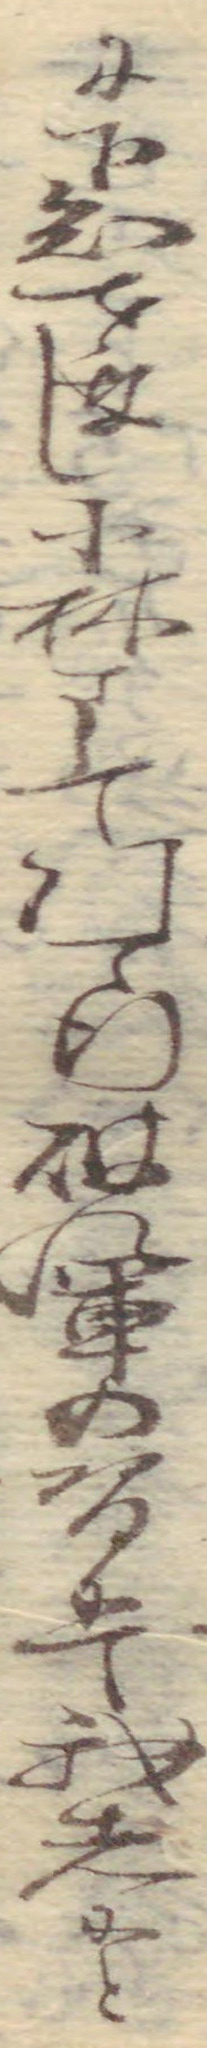に下知をなし小林さして引て行破れ軍の習にて我先にと
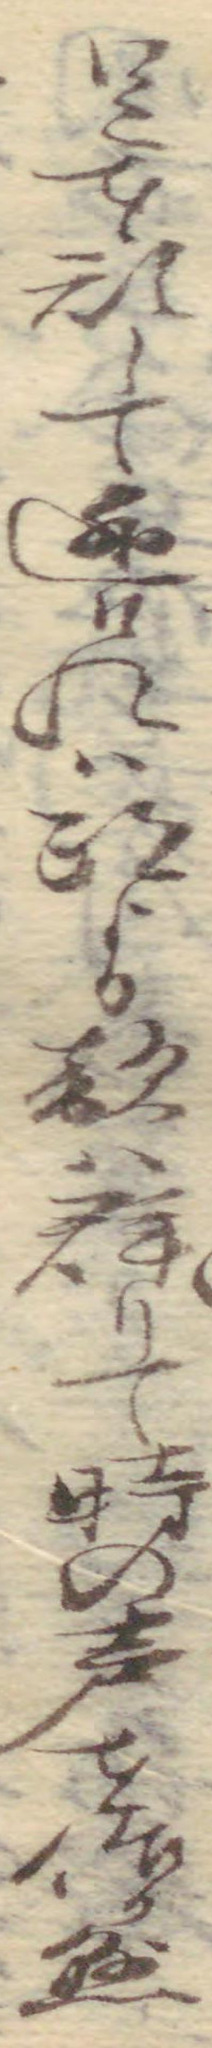足を乱して逃けれは跡より敵は群りて時の声を作り懸
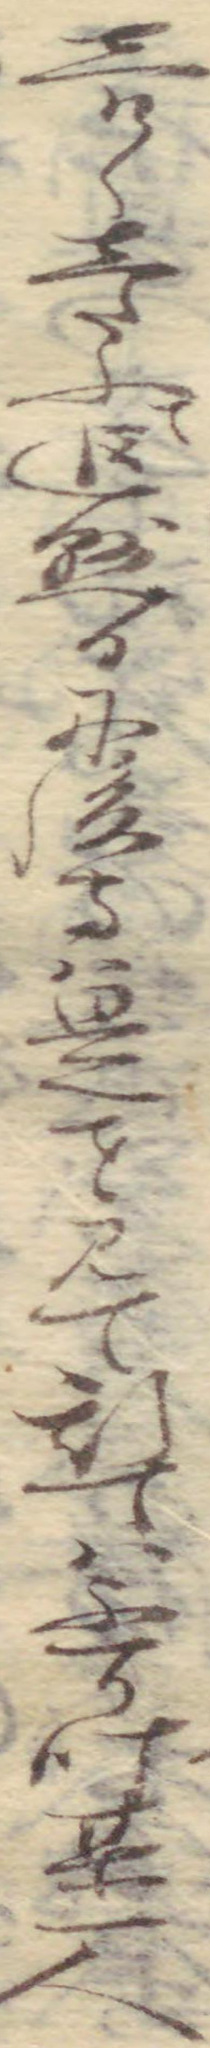しけくしたふて追懸る丹後守は是を見て斯ては不可叶某一人
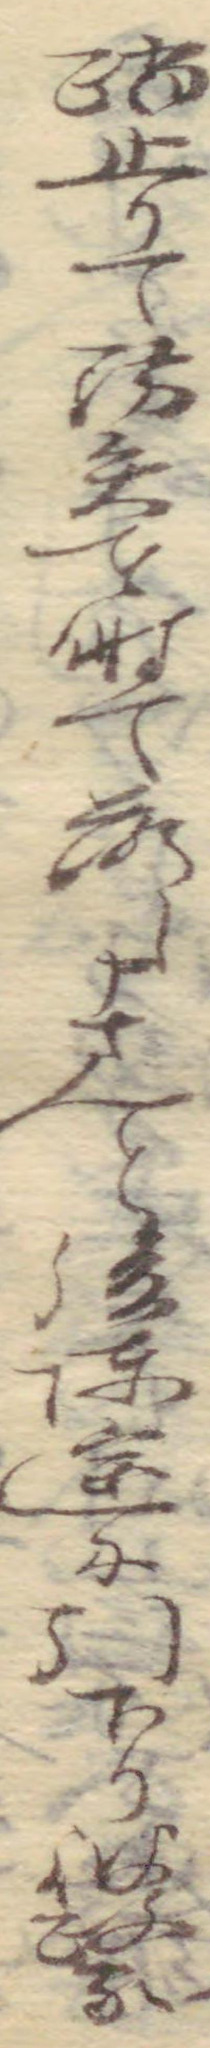踏止りて防矢を射て落し申さんと後陣遥に引下り彼政家
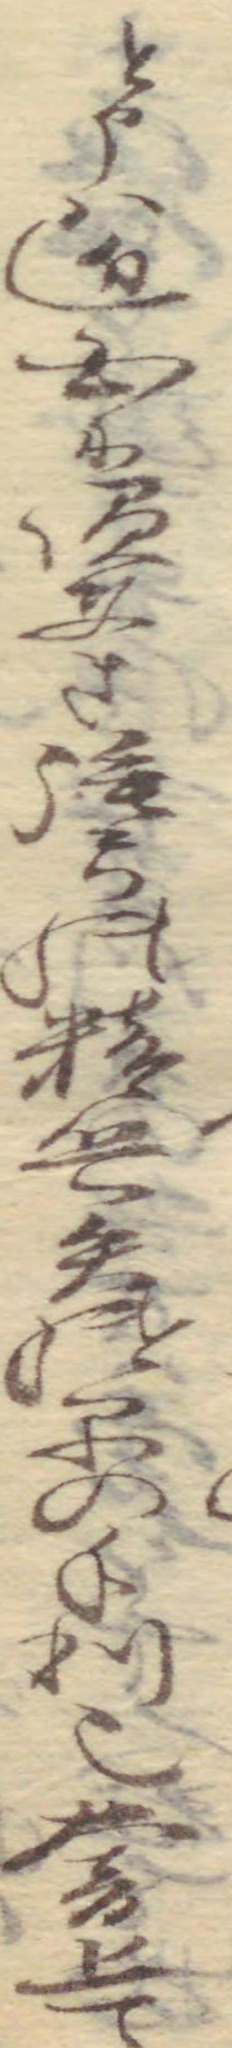と申は近国に隠なき強弓の精兵矢継早の手利也大音上て
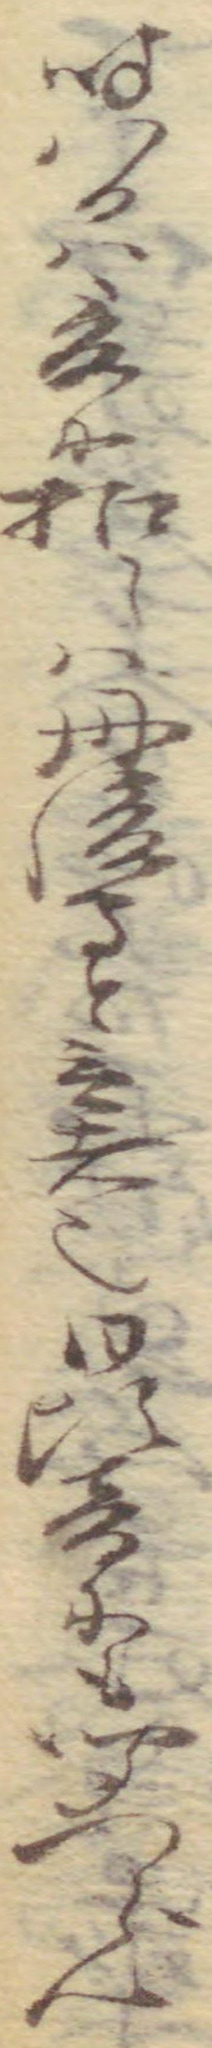呼はるは爰に扣しは丹後守と言者也日頃音にも聞つらん
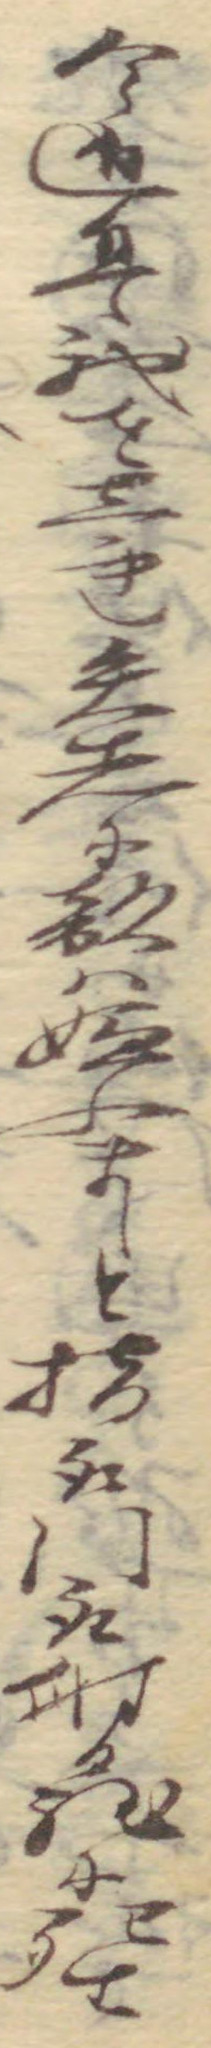今近付て我をしれ矢先に敵は嫌ふましと指取引取射る程に死生
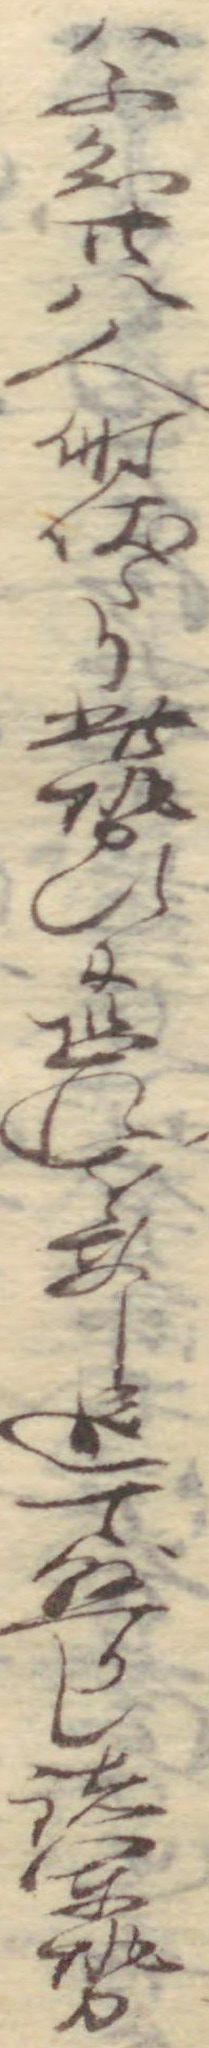は不知廿八人射伏たり此勢ひに恐れをなし追て懸りし諸軍勢
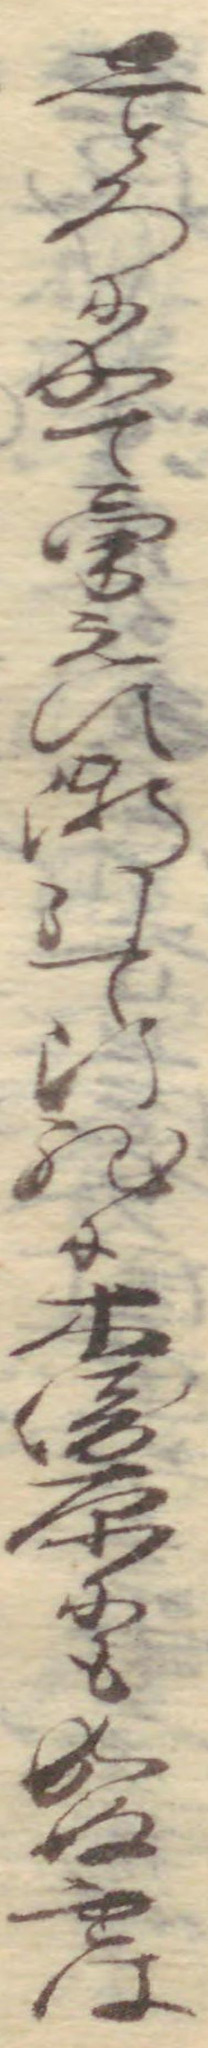しとろに成て勇えす漸引て行程に木崎原にも成ぬれは
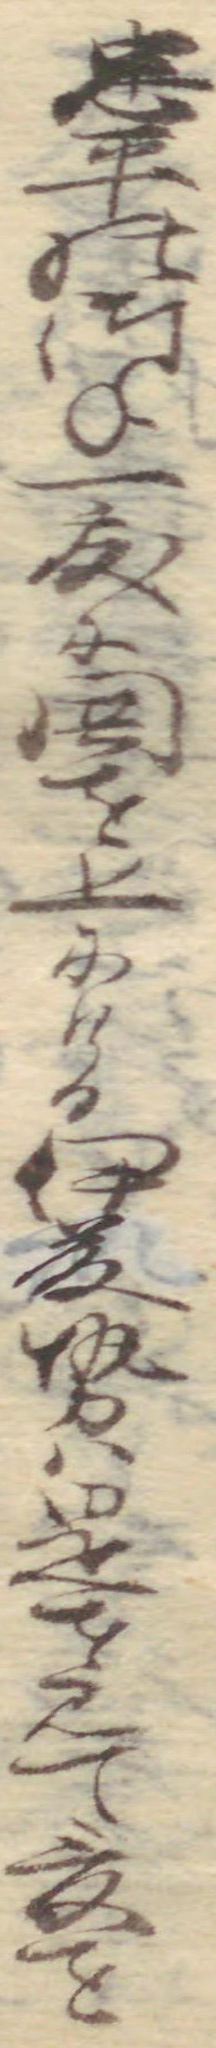忠平の御手一度に鬨を上にける伊藤勢は是を見て爰を
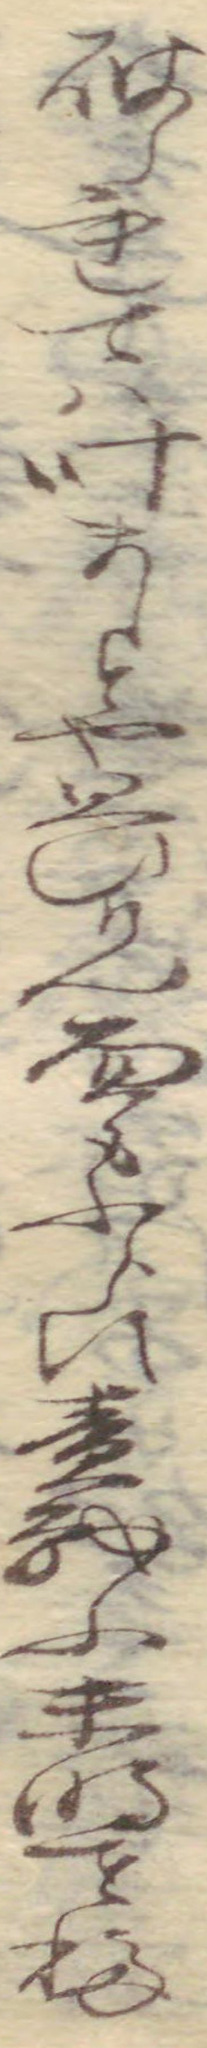破られては叶ましとや思ひけん面もふらす責戦ふ未時を移
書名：鶯宿雑記. 巻199-200
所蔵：国立国会図書館 National Diet Library, JAPAN
